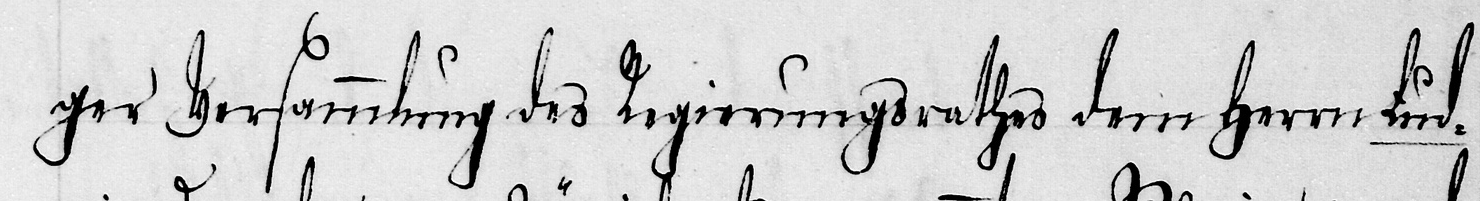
ger Versammlung des Regierungsrathes dem Herrn Lud¬
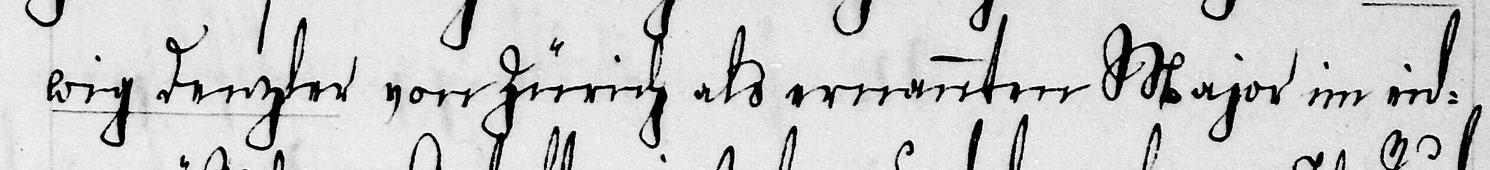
wig Denzler von Zürich als ernannten Major im eid¬
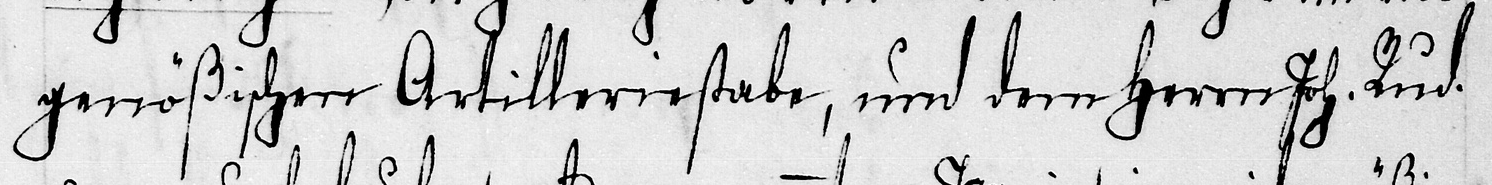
genößischen Artilleriestabe, und dem Herrn Joh. Rud.
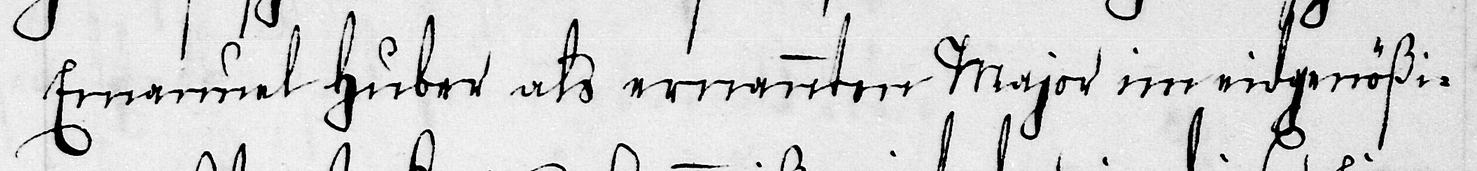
Emanuel Huber als ernannten Major im eidgenößi¬
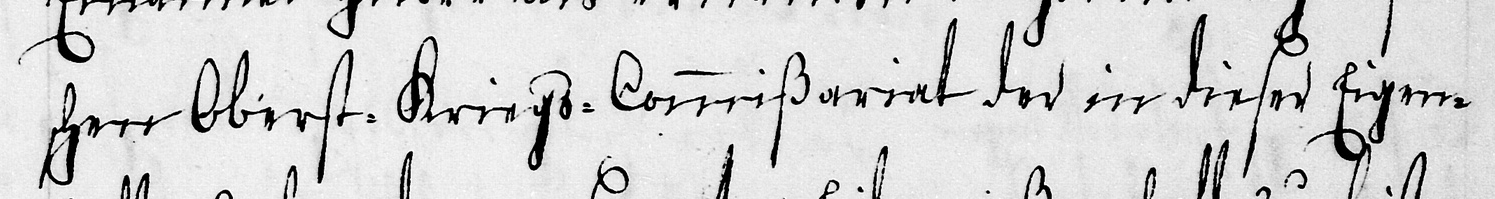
schen Oberst-Kriegs-Commißariat der in dieser Eigen¬
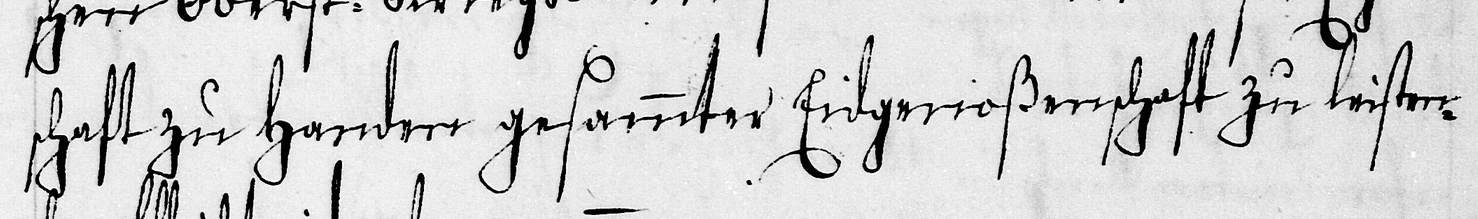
schaft zu Handen gesammter Eidgenoßenschaft zu leisten¬
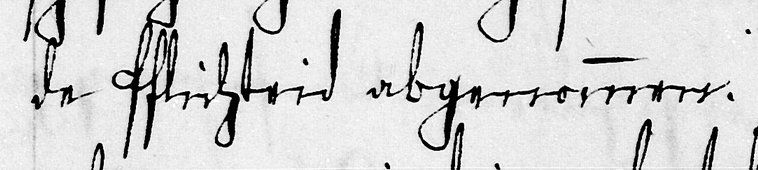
de Pflichteid abgenommen.
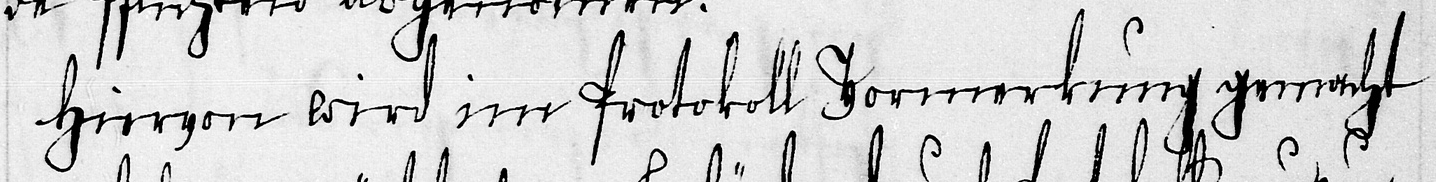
Hiervon wird im Protokoll Vormerkung gemacht
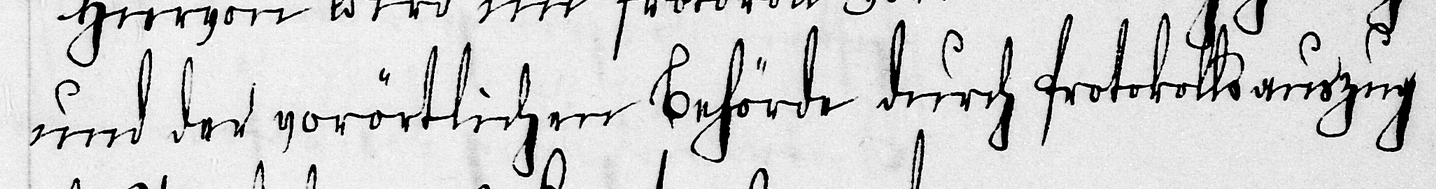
und der vorörtlichen Behörde durch Protokollsauszug
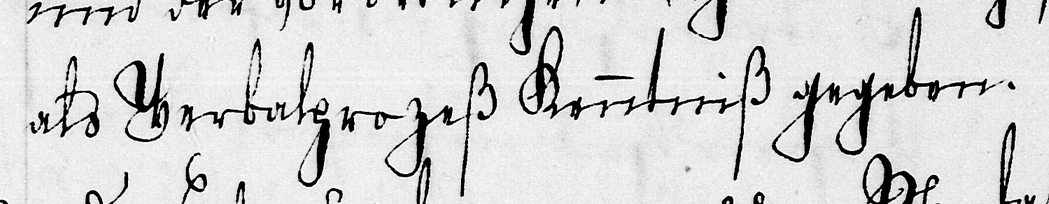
als Verbalprozeß Kenntniß gegeben.
